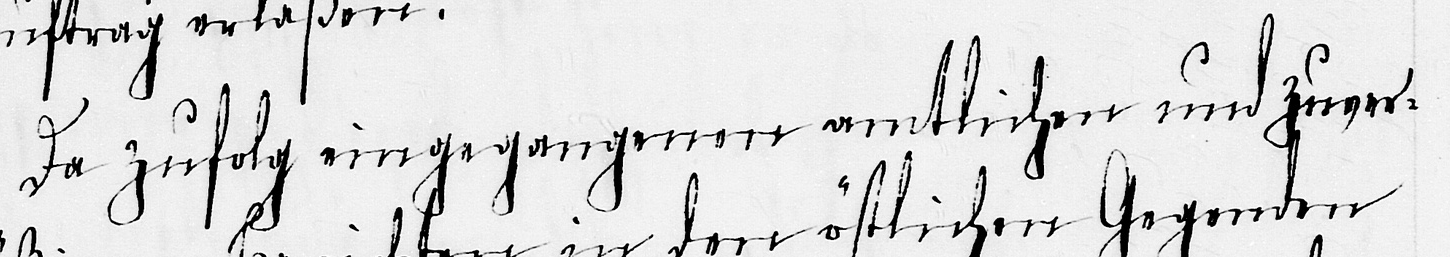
Da zufolg eingegangenen amtlichen und zuver¬
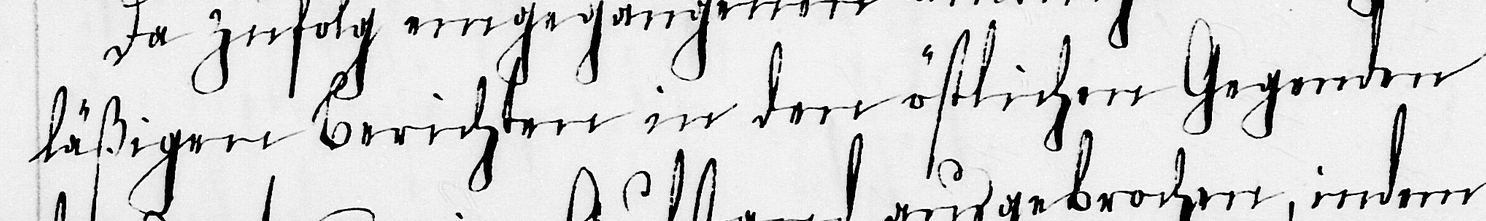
läßigen Berichten in den östlichen Gegenden
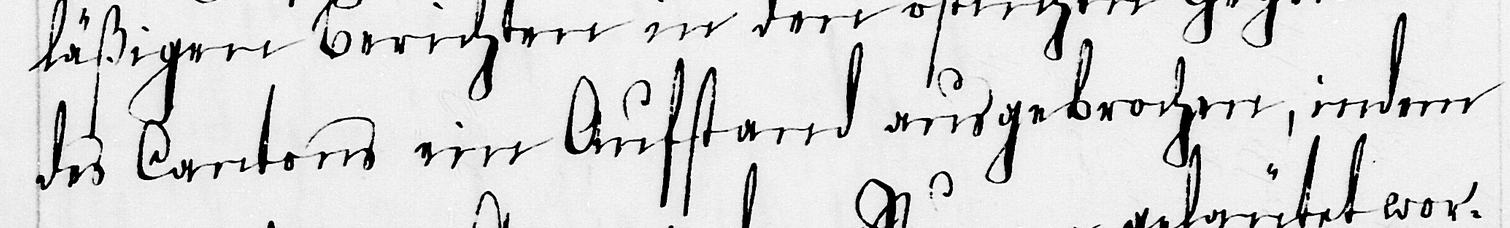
des Cantons ein Aufstand ausgebrochen, indem
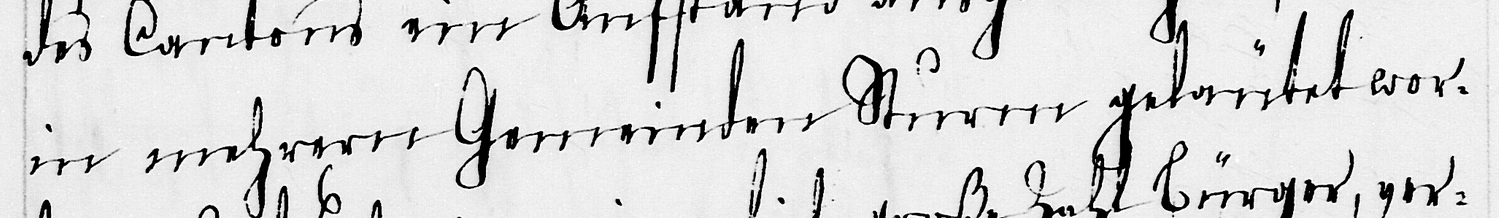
in mehrern Gemeinden Sturm geläutet wor¬
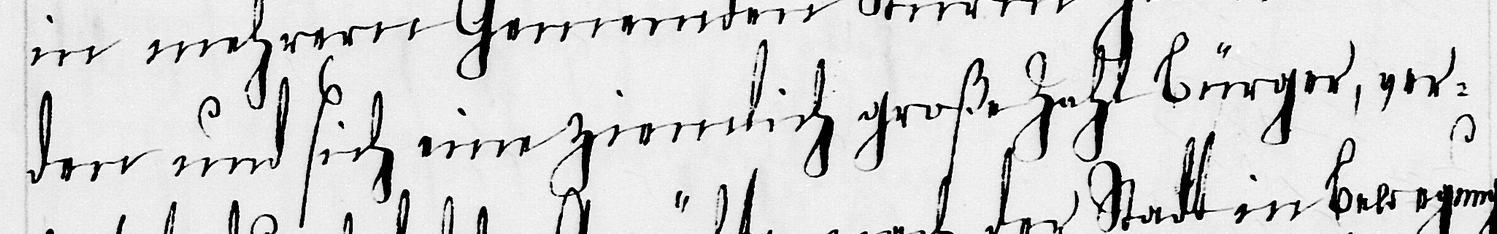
den und sich eine ziemlich große Zahl Bürger, ver¬
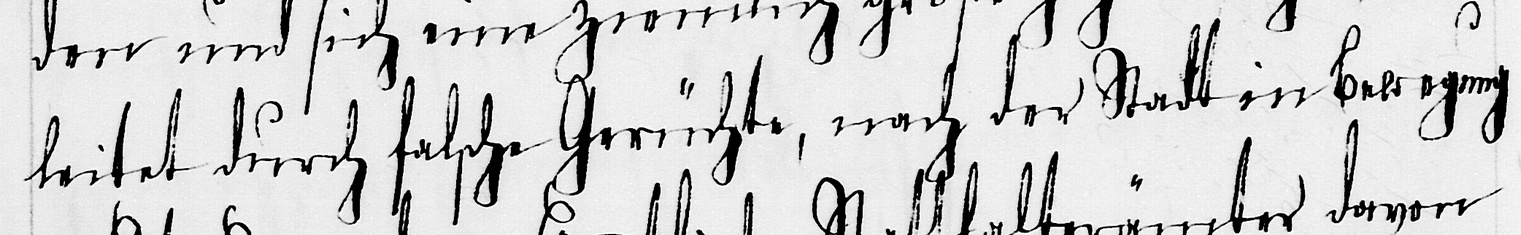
leitet durch falsche Gerüchte, nach der Stadt in Bewegung
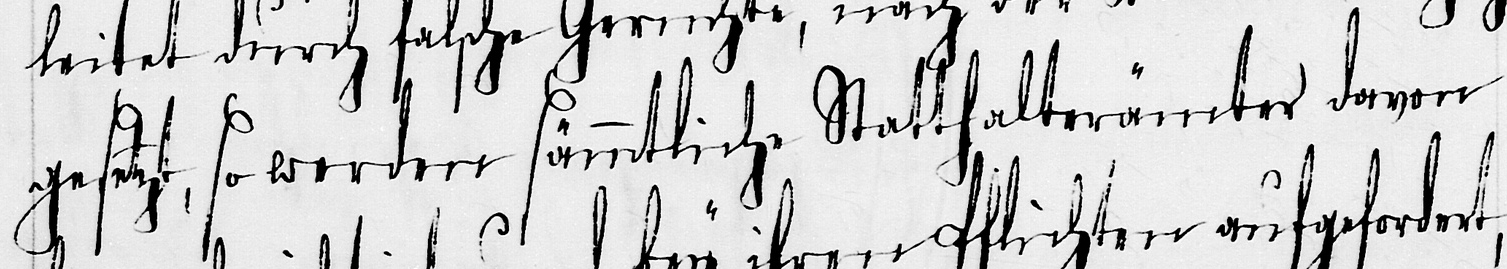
gesetzt, so werden sämmtliche Statthalterämter davon
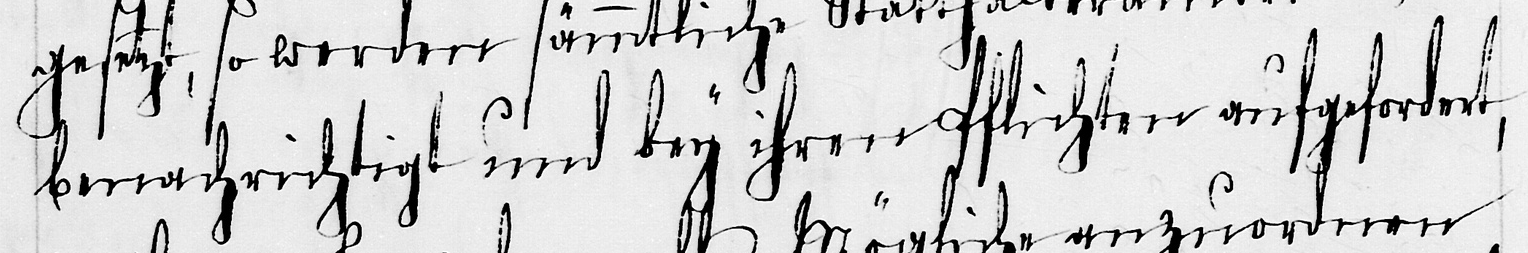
benachrichtigt und bey ihren Pflichten aufgeforder¬
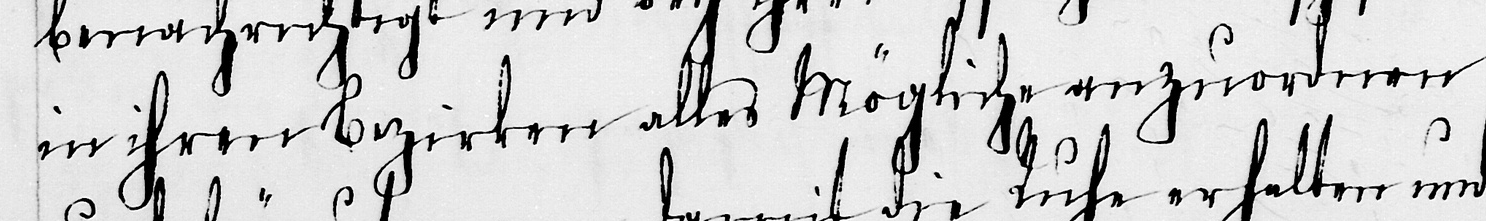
in ihren Bezirken alles Mögliche anzuordnen
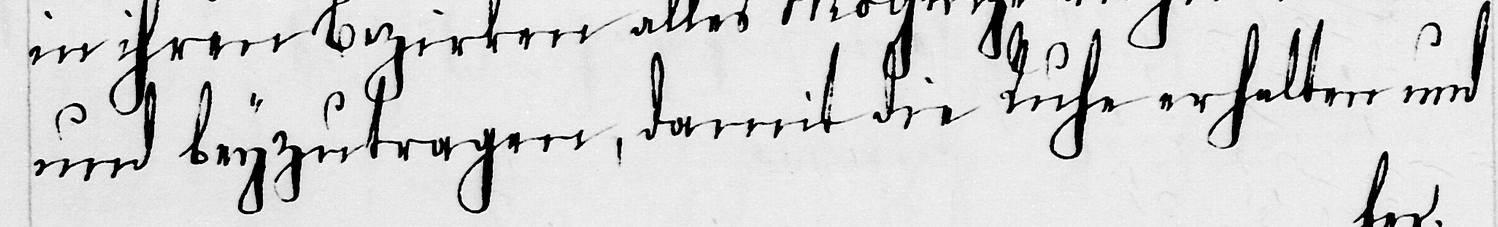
und beyzutragen, damit die Ruhe erhalten und
